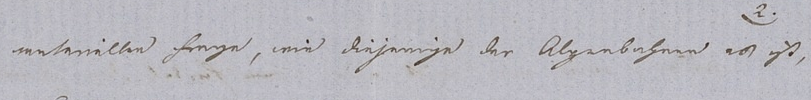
materiellen Frage, wie diejenige der Alpenbahnen es ist,
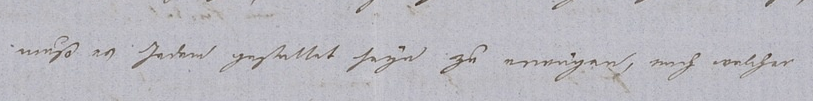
muß es Jedem gestattet seyn zu erwägen, nach welcher
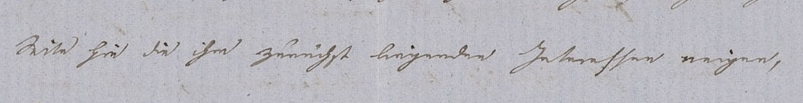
Seite hin die ihm zunächst liegenden Interessen neigen,
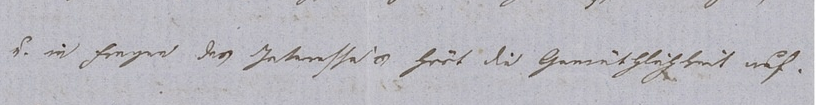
u. in Fragen des Interesse's hört die Gemüthlichkeit auf.
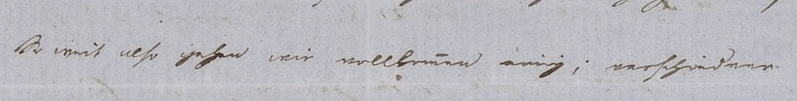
So weit also gehen wir vollkommen einig, verschiedener
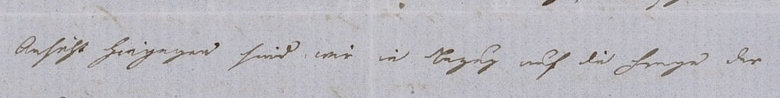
Ansicht hingegen sind wir in Bezug auf die Frage der
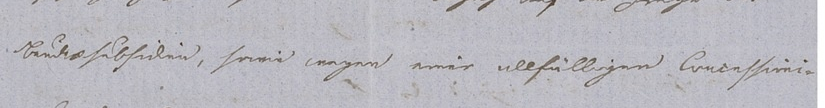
Bundessubsidien, sowie wegen einer allfälligen Concessioni-
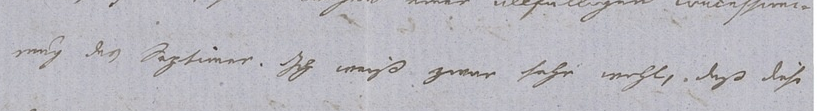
rung des Septimer. Ich weiß zwar sehr wohl, daß diese
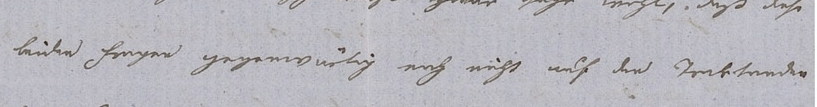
beiden Fragen gegenwärtig noch nicht auf den Traktanden
